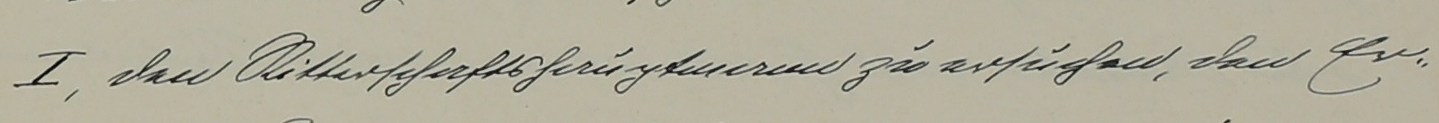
I. den Ritterschaftshauptmann zu ersuchen, den Er-
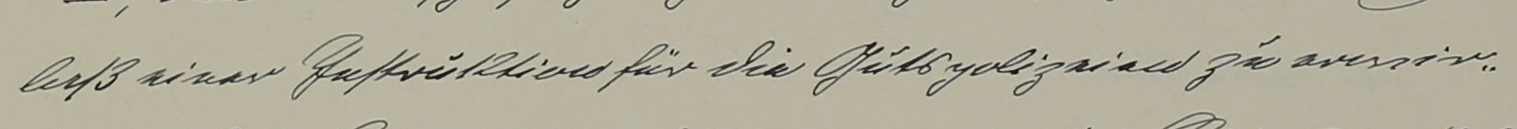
laß einer Instruktion für die Gutspolizeien zu erwir-
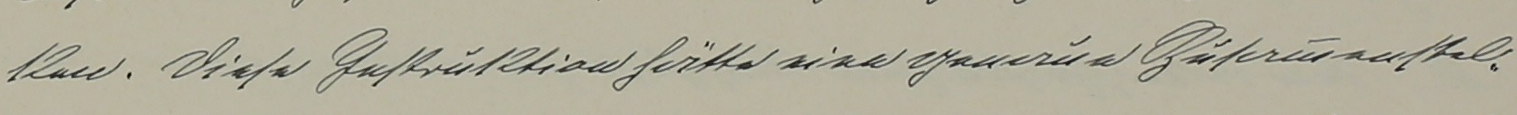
ken. Diese Instruktion hätte eine genaue Zusammenstel-
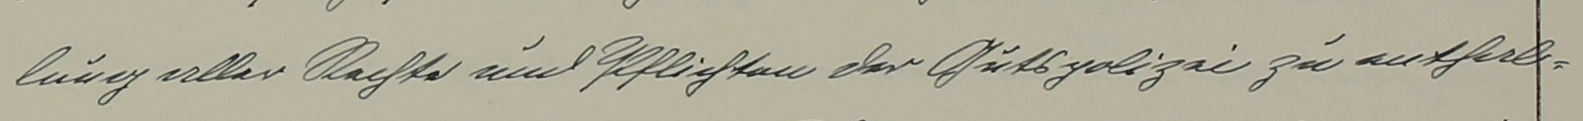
lung aller Rechte und Pflichten der Gutspolizei zu enthal-
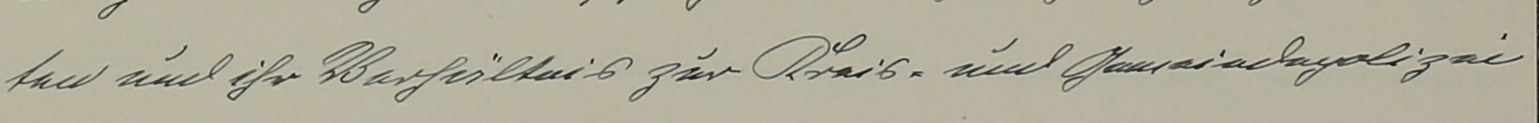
ten und ihr Verhältnis zur Kreis- und Gemeindepolizei
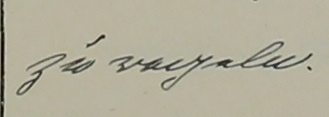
zu regeln.
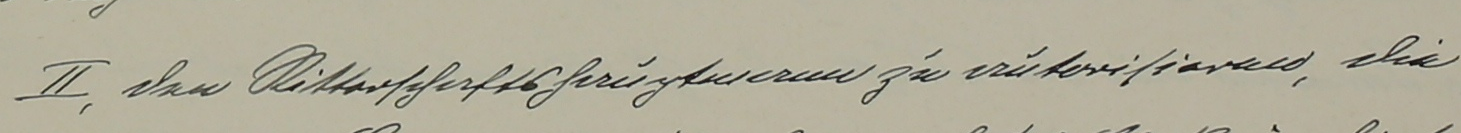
II. Den Ritterschaftshauptmann zu autorisieren, die
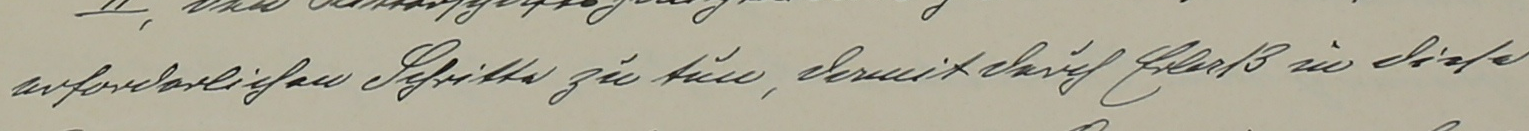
erforderlichen Schritte zu tun, damit durch Erlaß in diese
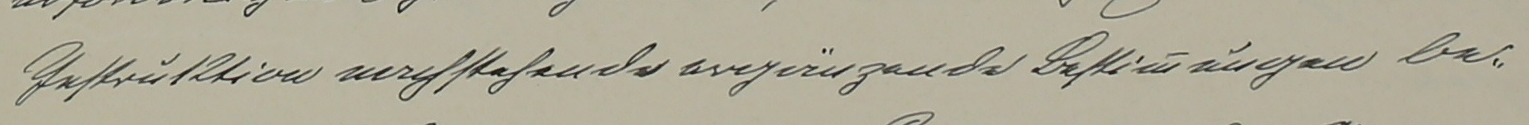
Instruktion nachstehende ergänzende Bestimmungen be-
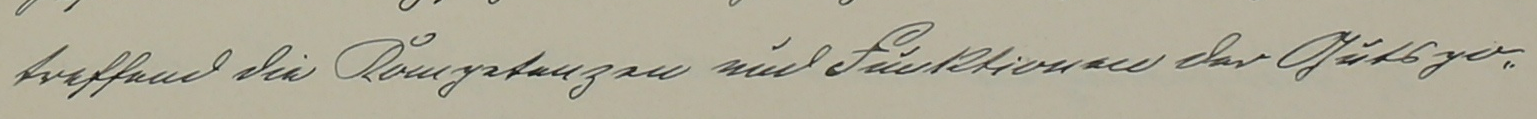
treffend die Kompetenzen und Funktionen der Gutspo-
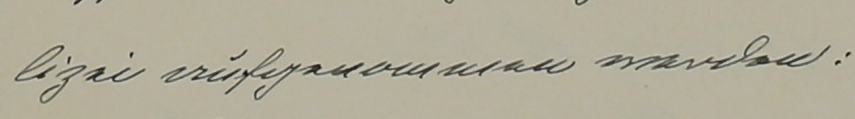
lizei aufgenommen werden:
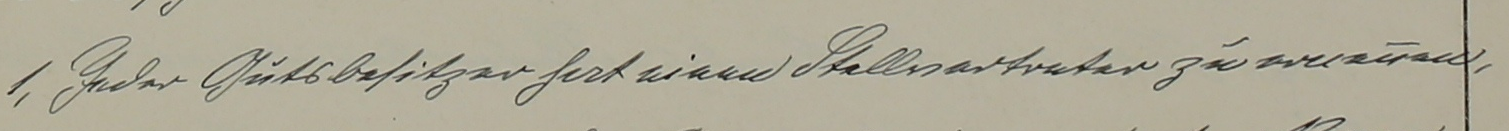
1. Jeder Gutsbesitzer hat einen Stellvertreter zu ernennen,
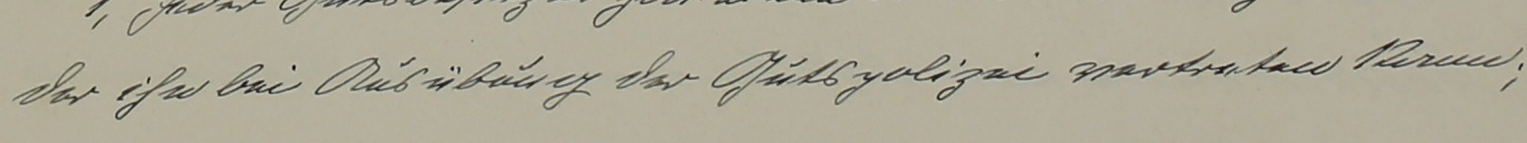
der ihn bei der Ausübung der Gutspolizei vertreten kann;
